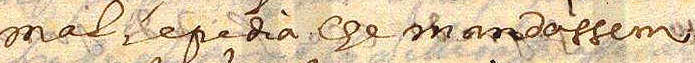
mal, e pedia lhe mandassem
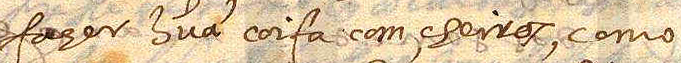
fazer huā coifa com, cheiros, como
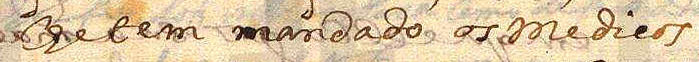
lhe tem mandado os medicos
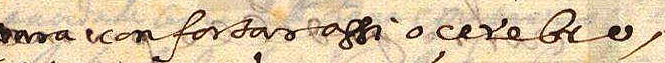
para confortar assi o çerebro,
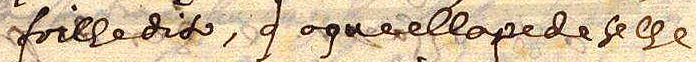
foilhe dito, q̄ o que ella pede se lhe
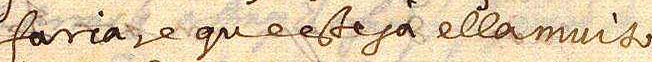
faria, e que esteja ella muito
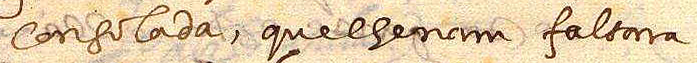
consolada, que lhe nam faltara
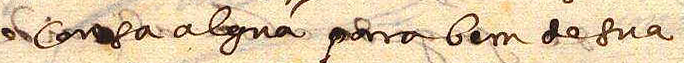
cousa alguā para bem de sua
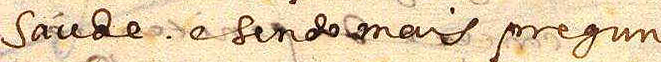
Saude. e sendo mais pregun
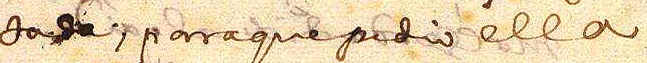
tada; para que pedio ella
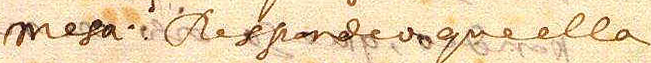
mesa. Respondeo que ella
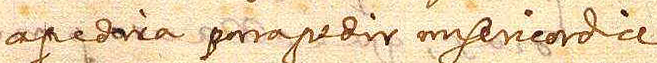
a pedira para pedir misericordia
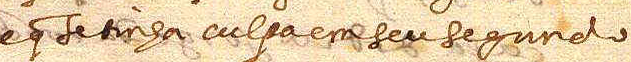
e q̄ se tinha culpa em seu segundo
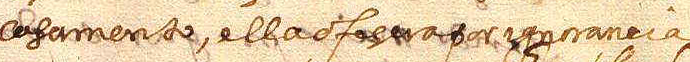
casamento, ella o fesera por ignorançia
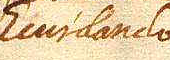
E cuidando
